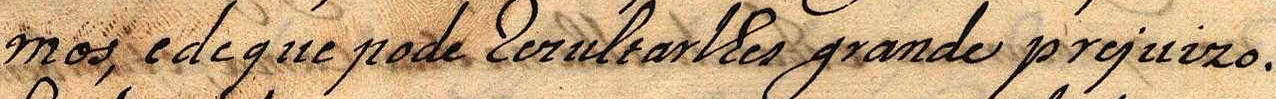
mos, e de que pode Resultar lhes grande prejuizo.
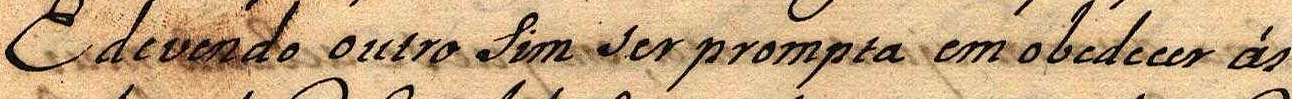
E devendo outroSim ser prompta em obedecer ás
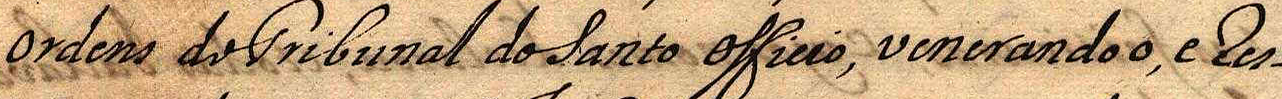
ordens do Tribunal do Santo Officio, venerendoo e Res
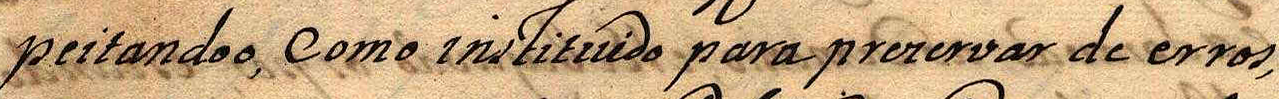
peitandoo, como instituído para preservar de erros,
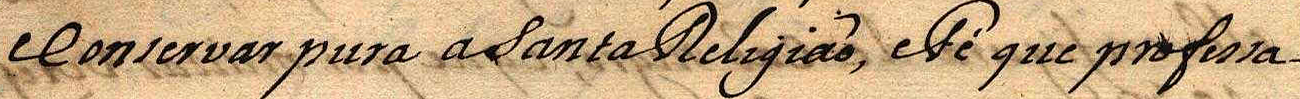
e Conservar pura a Santa Religiaõ, e Fé que professa
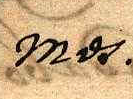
mos.
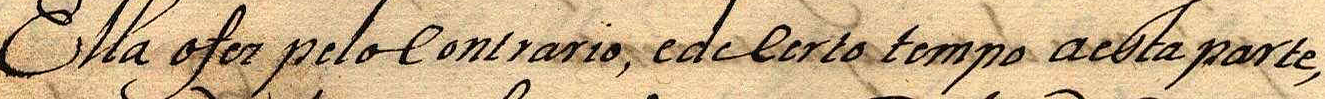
Ella o fez pelo contrario, e de certo tempo a esta parte,
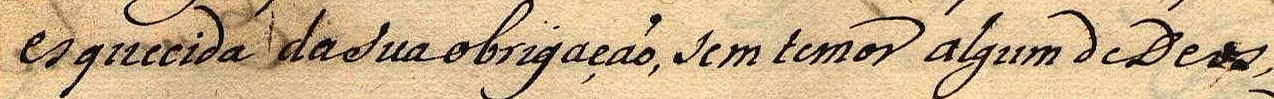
esquecida da sua obrigaçaõ , sem temor algum de Deos,
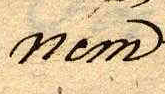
nem
